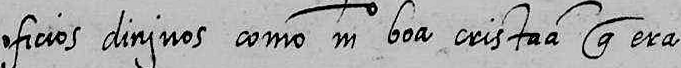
oficios diujnos como mto boa cristaā q̄ era
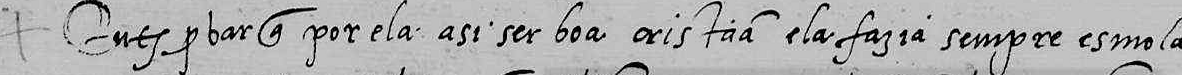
4 Entꝭ ꝓvar q̄ por ela asi ser boa cristaā ela fazia sempre esmola
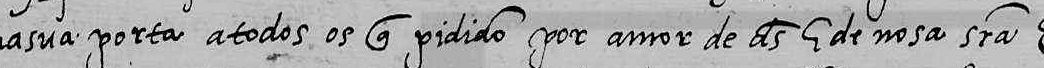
aa sua porta a todos os q̄ pidiaõ por amor de d̄s E de nosa srā E
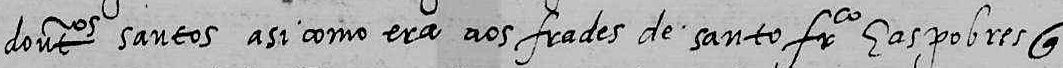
doutros santos asi como era aos frades de santo frco E as pobres q̄
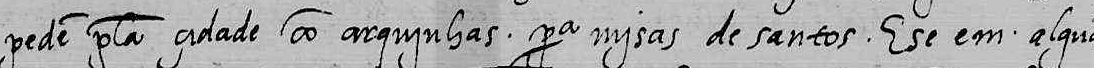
pedē p̄la cidade c̄o arquinhas . ꝑa mjsas de santos . E se em alguā
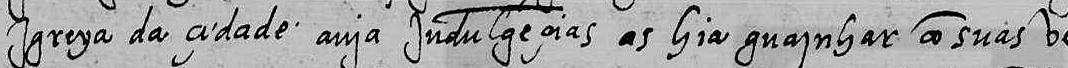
Jgreya da cidade auja Jndulgēcias as hia guajnhar cō suas ve
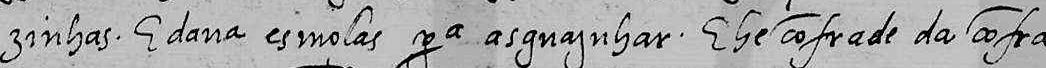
zinhas. E daua esmolas ꝑa as guajnhar . E he c̄ofrade da c̄ofra
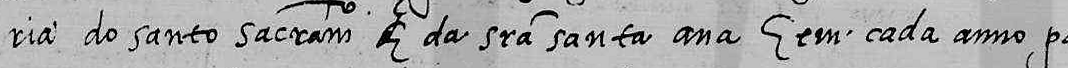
ria do santo sacramto E da srā santa ana E em . cada anno pa
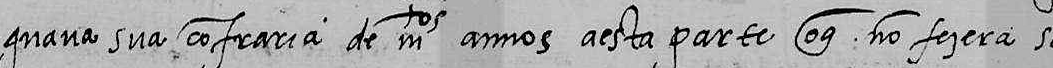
guaua sua c̄ofraria de mtos annos a esta parte o q̄ nō fezera se
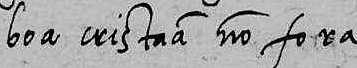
boa cristaā n̄o fora
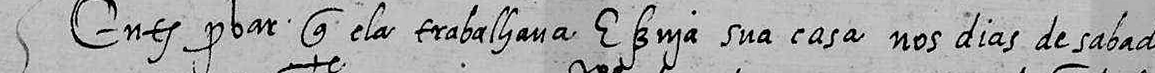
5 Entꝭ ꝓvar q̄ ela trabalhaua E ꞩuja sua casa nos dias de sabado
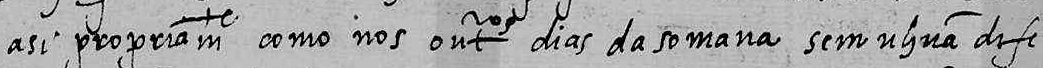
asi propriamte como nos outros dias da somana sem nhūa dife
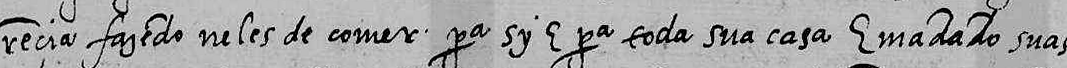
r̄ecia fazēdo neles de comer ꝑa sy E ꝑa toda sua casa E mādādo suas
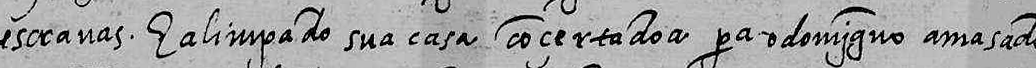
escrauas. E alimpādo sua casa c̄ocertādoa ꝑa o domj̄guo amasādo
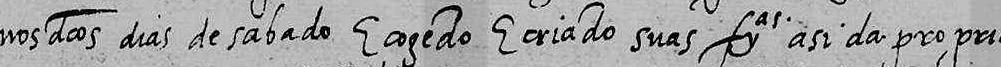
nos d̄cos dias de sabado E cozēdo E criādo sua fyas asi da propria
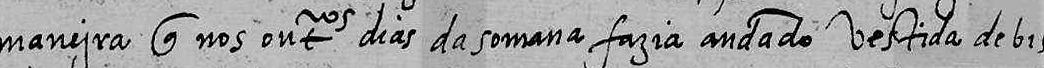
manejra q̄ nos outros dias da somana fazia andādo vestida de vis
